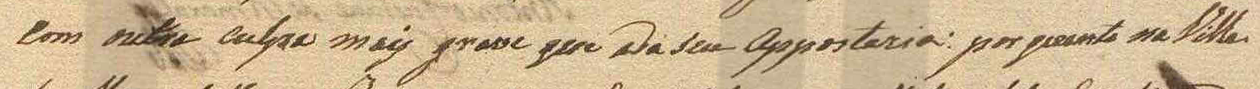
com outra culpa mais grave que a da sua Appostazia: porquanto na Villa
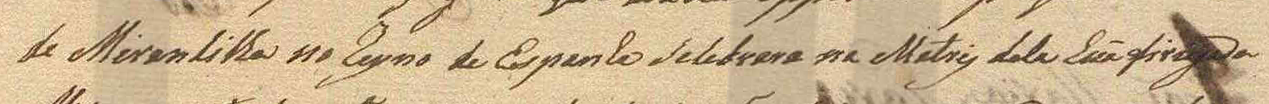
de Mirandilha no Reyno de Espanha selebrara na Matris dela huā fingida
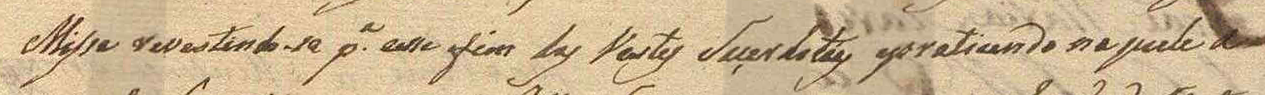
Missa revestindo-se p.a este fim das Vestes Sacerdotais e praticando naquele a
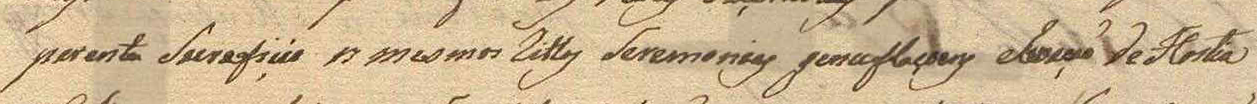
parente Sacreficio os mesmos Rittos Seremonias genuflaçoens elevaçaõ de Hostia
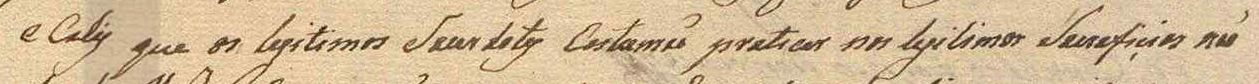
e Calis que os legitimos Sacerdotes Costumaõ praticar nos Legitimos Sacreficios naõ
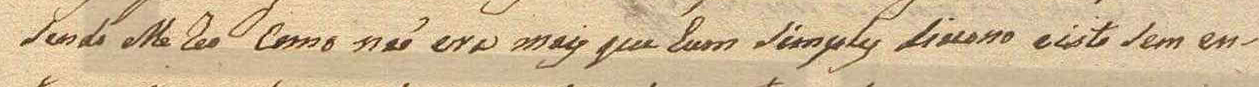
sendo elle Reo como naõ era mais que hum simples diacono e isto sem en
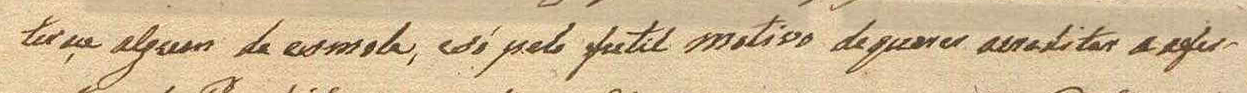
terece algum da esmola, e só pelo futil motivo de querer acreditar a afer
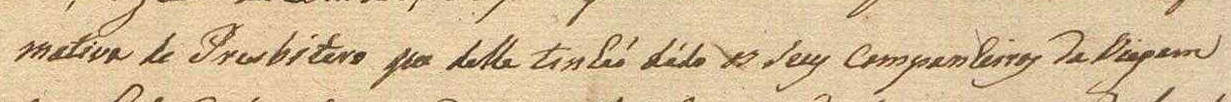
mativa de Presbitero que delle tinhaõ dádo os seus Companheiros da Viagem
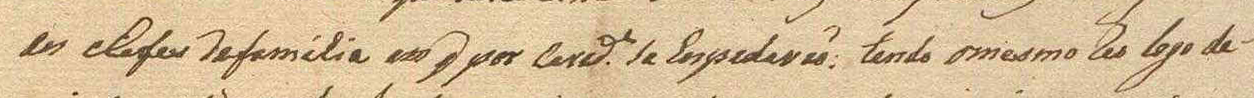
aos chefes da familia em q̄ por cared.e se hospedaraõ; tendo o mesmo Reo logo de
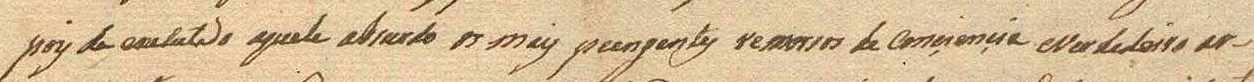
pois de executado aquele absurdo os mais pungentes remorsos de conciencia e verdadeiro ar
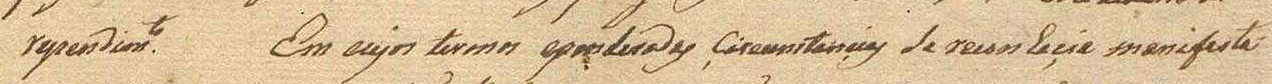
rependim.to Em cujos termos e ponderadas circunstancias se reconhecia manifesta
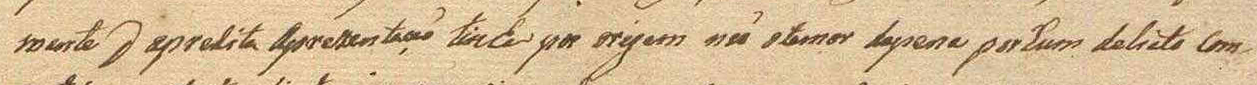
mante q̄ a predita aprezentaçaõ tinha por origem naõ o temor da pena por hum delicto com
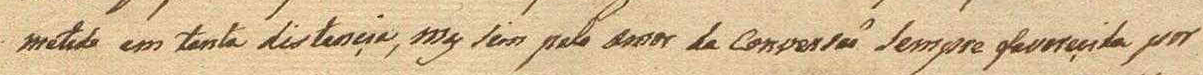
metido em tanta distancia, mas sim pelo amor da conversaõ sempre favorecida por
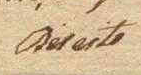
Direito
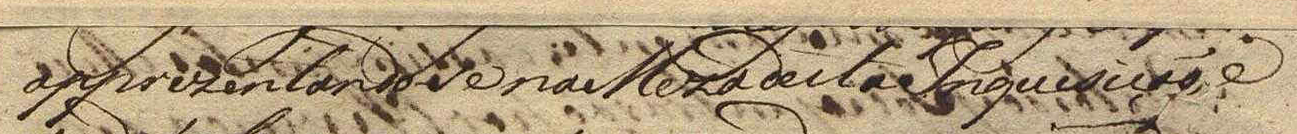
apprezentando-se na Meza desta Inquisiçaõ, e
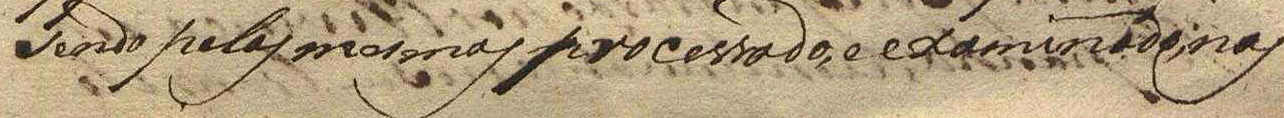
sendo pelas mesmas processado, e examinado, nas
